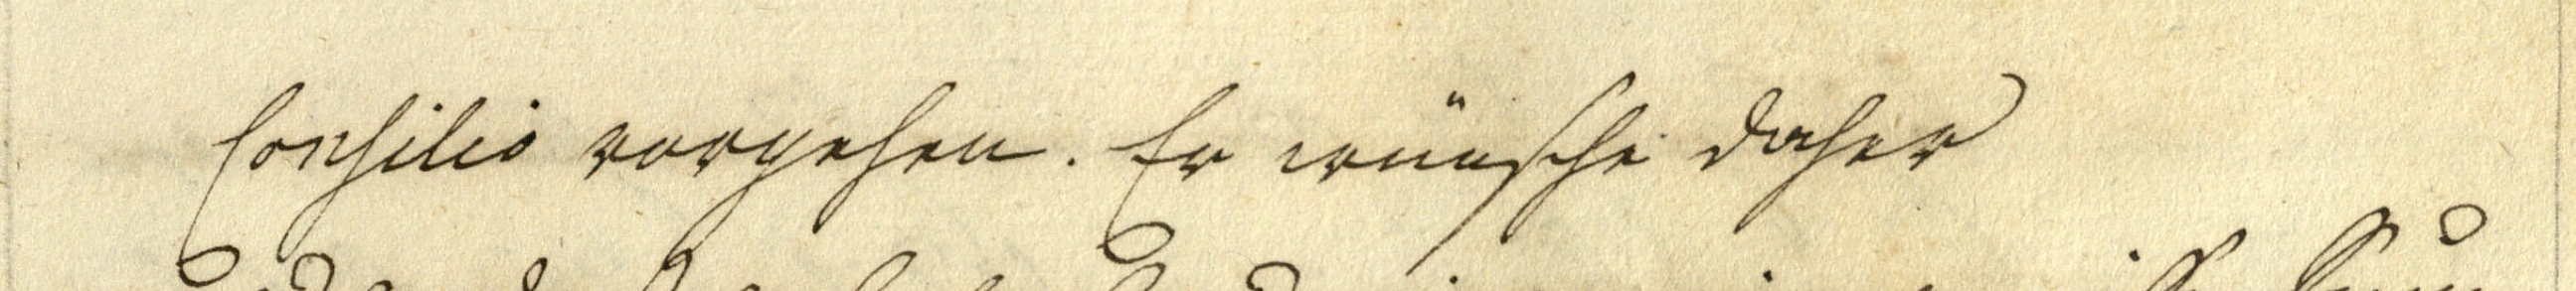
Consilio vorgehen. Er wünsche daher
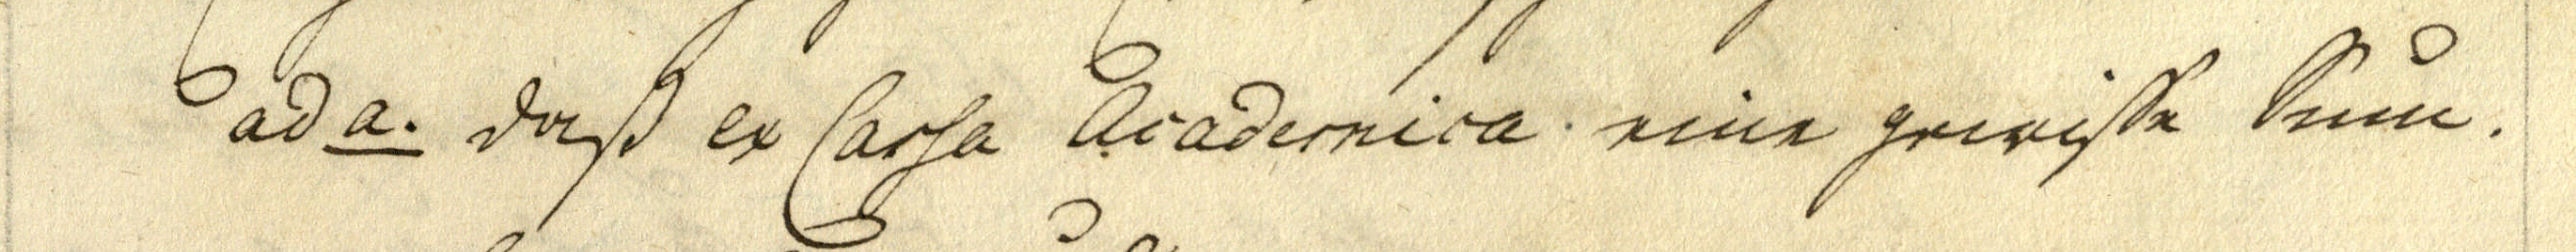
ad a. daß ex Cassa Academica eine gewisse Sum-
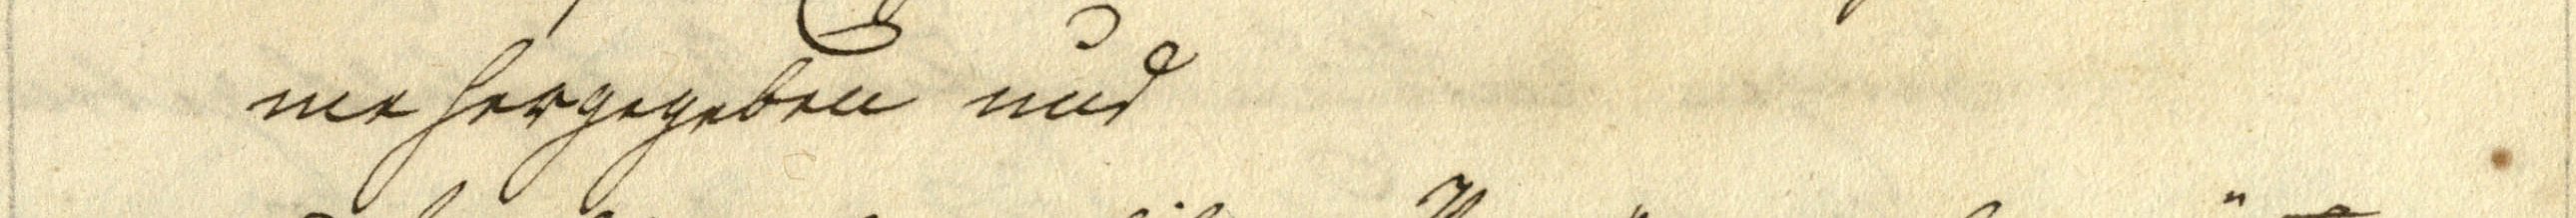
me hergegeben und
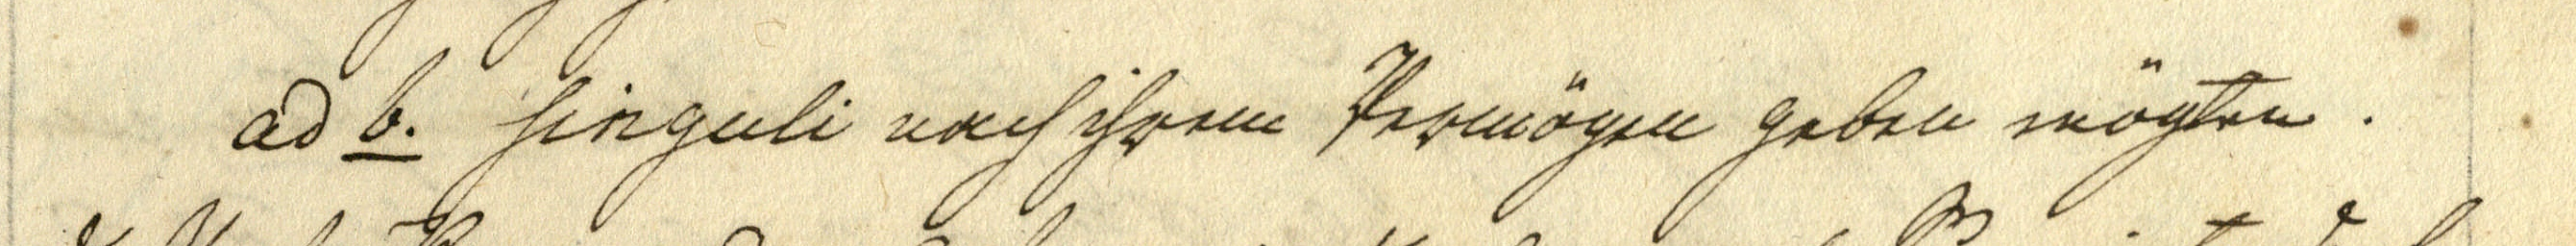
ad b. singuli nach ihrem Vermögen geben mögten.
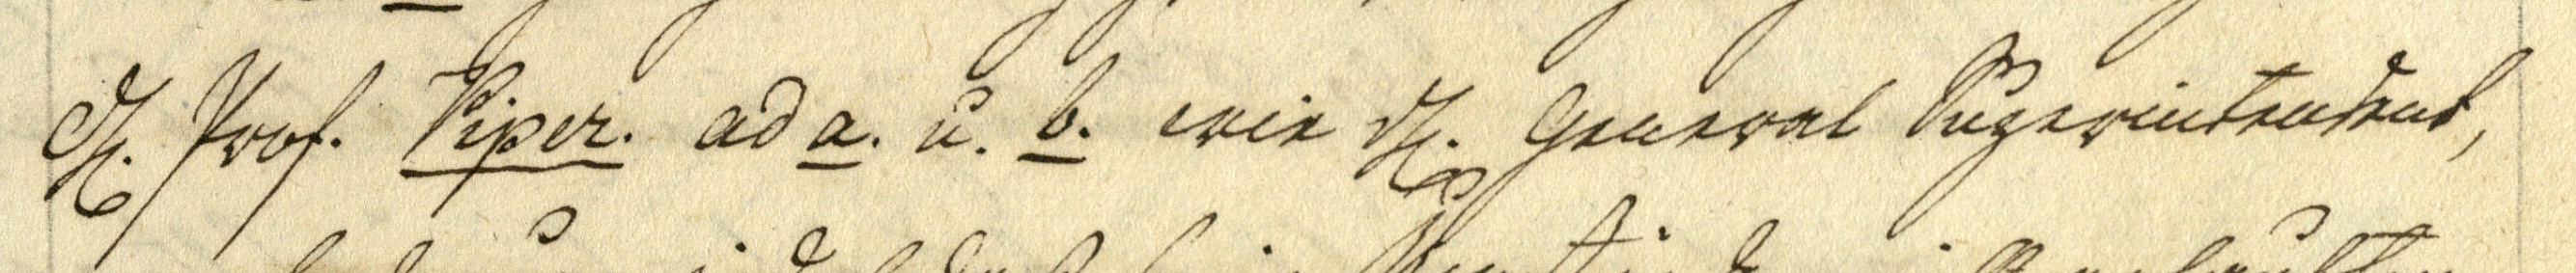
dh. Prof. Piper ad a. u. b. wie dh. General Superintendent,
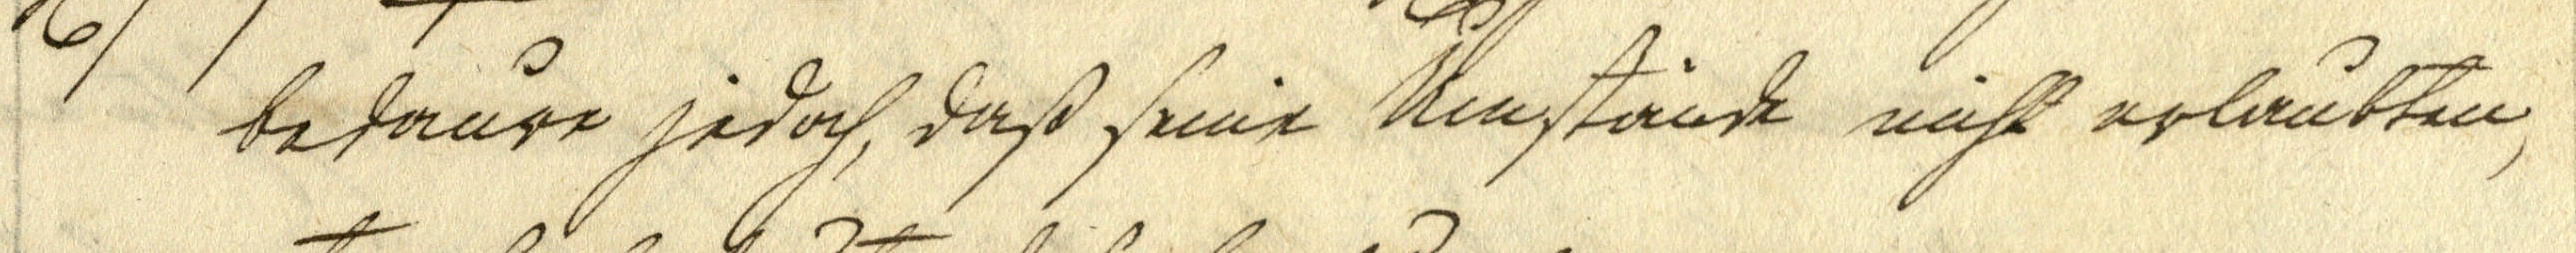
bedaure jedoch, daß seine Umstände nicht erlaubten,
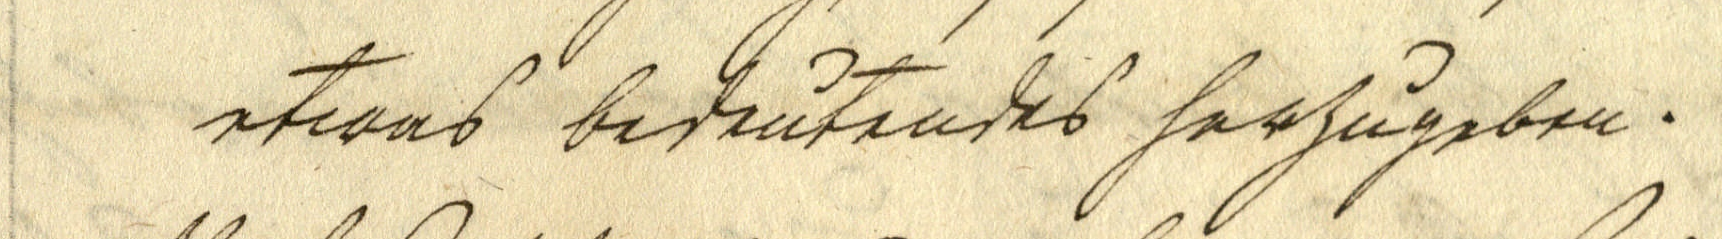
etwas bedeutendes herzugeben.
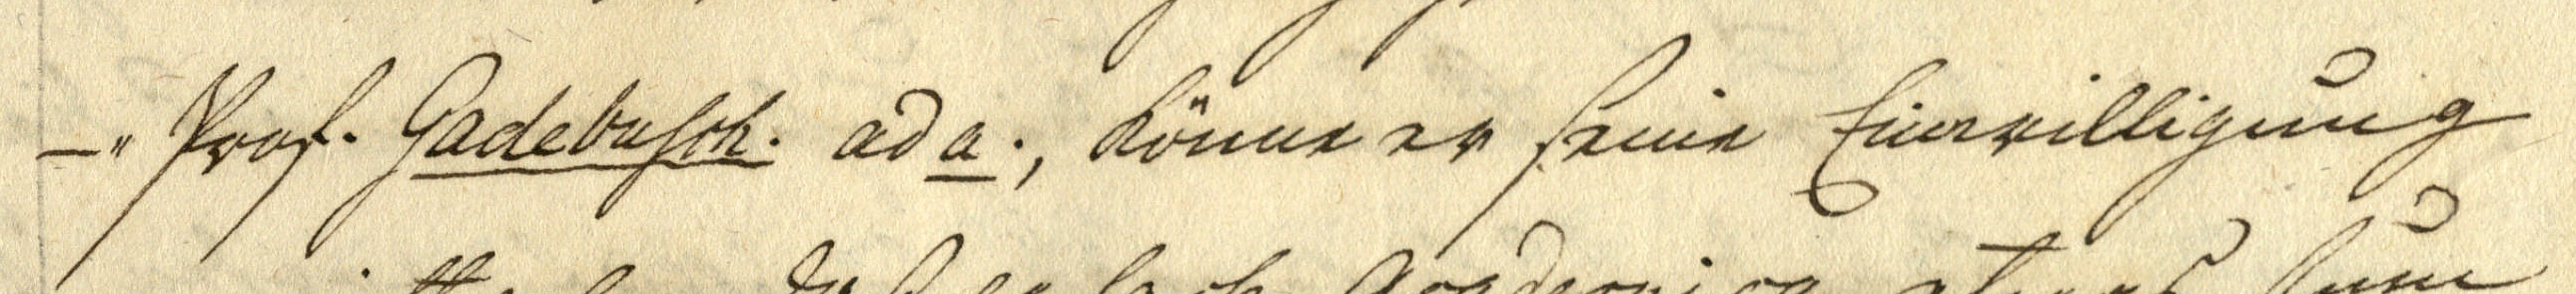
- " Prof. Gadebusch. ad a., könne er seine Einwilligung
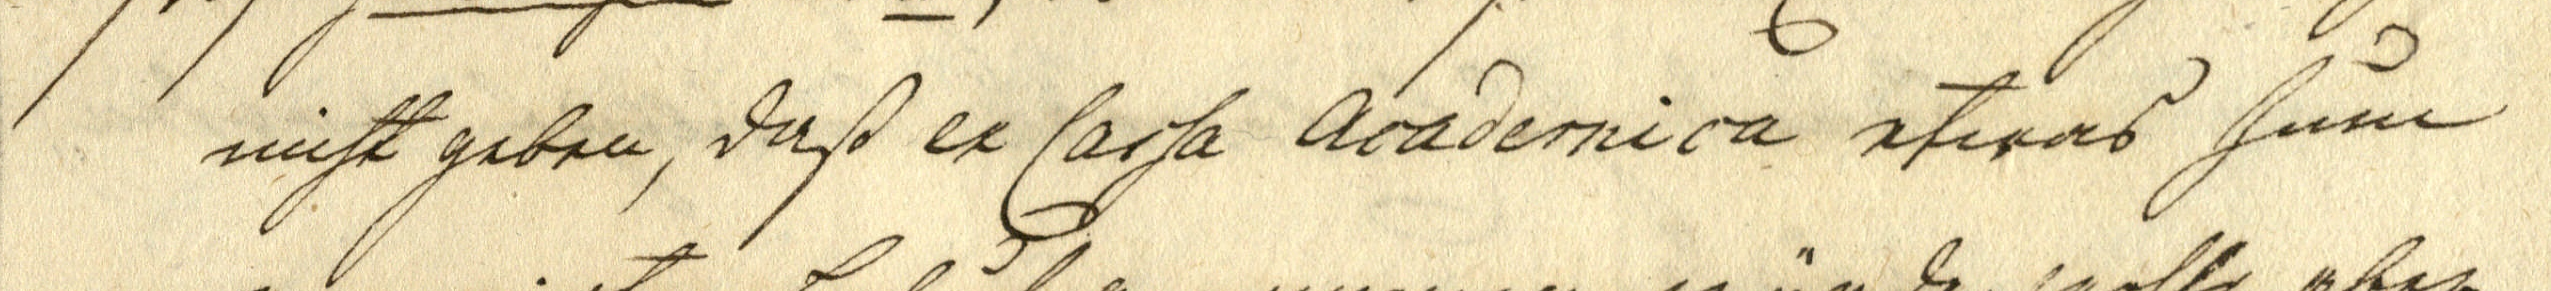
nicht geben, daß ex Cassa Academica etwas zum
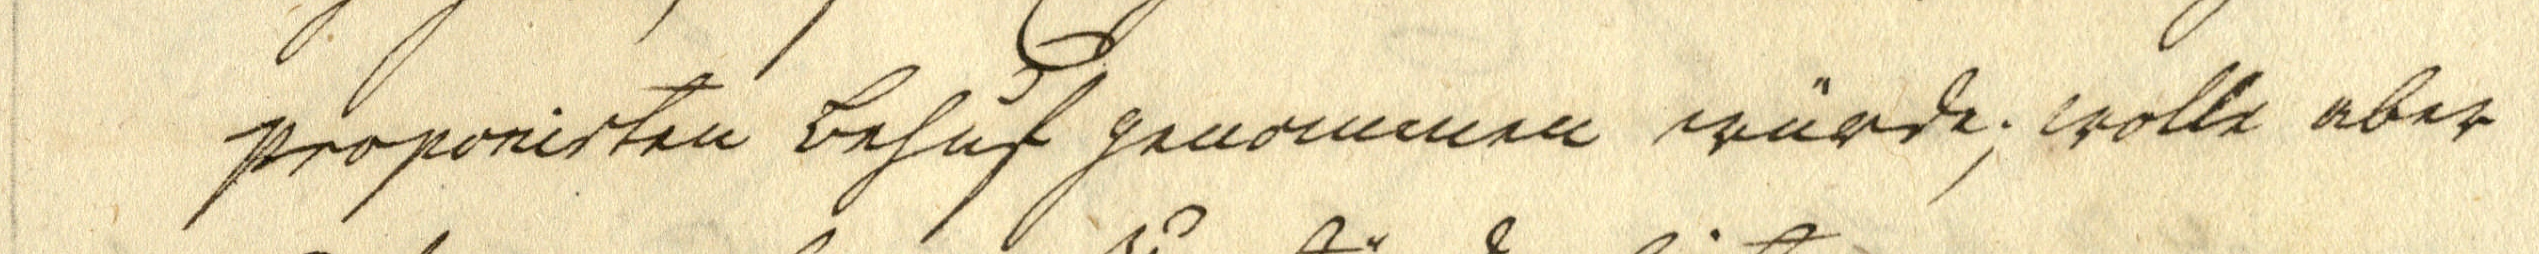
proponirten Behuf genommen würde; wolle aber
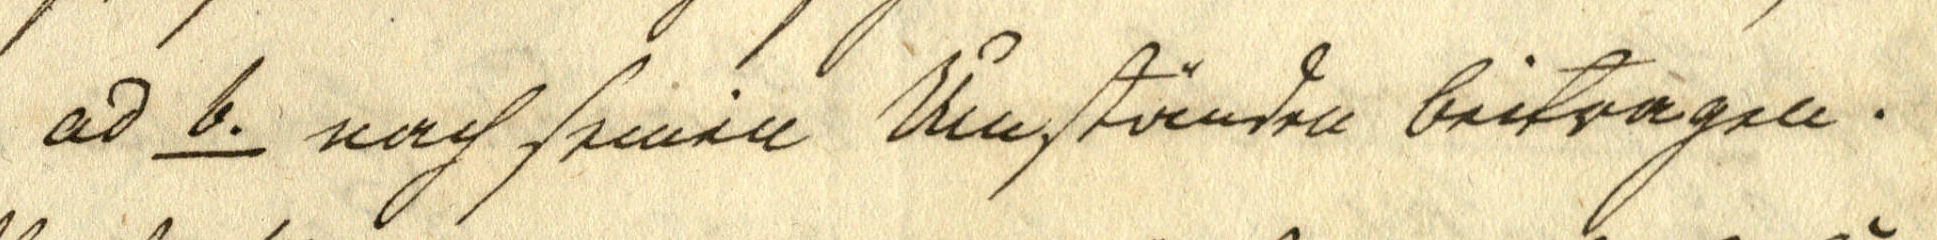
ad b. nach seinen Umständen beitragen.
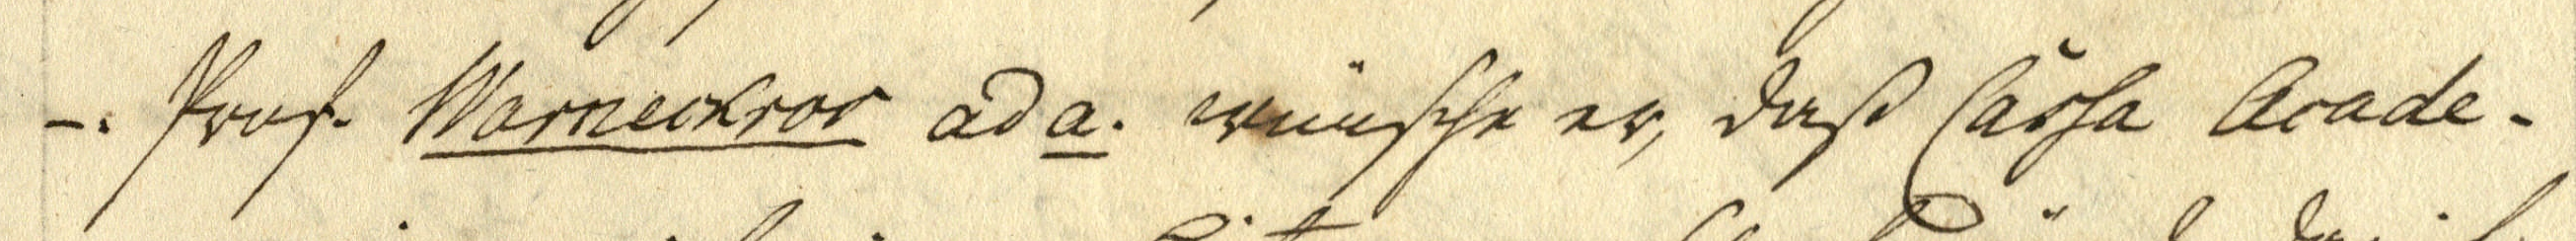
- " Prof. Warneckros ad a. wünsche er, daß Cassa Acade-
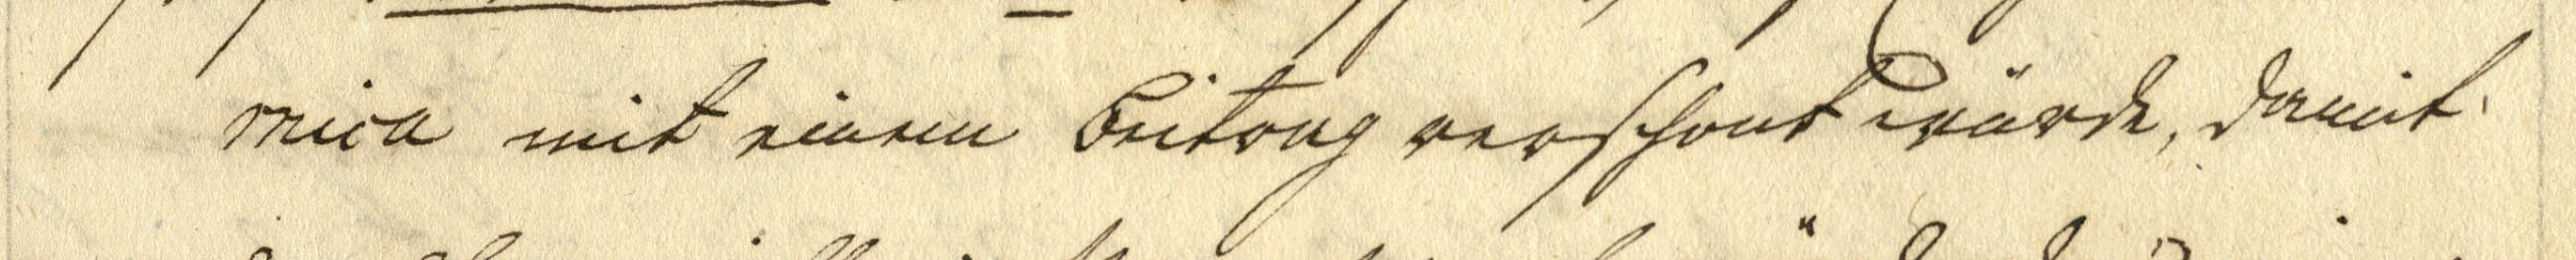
mica mit einem Beitrag verschont würde, damit
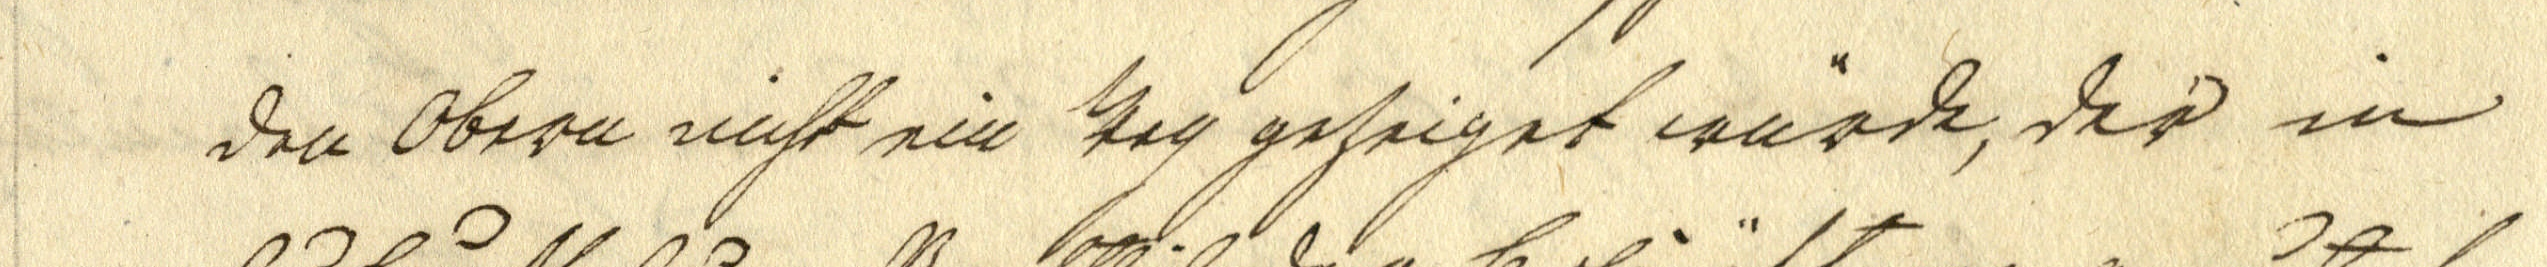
den Obern nicht ein Weg gezeiget würde, der in
